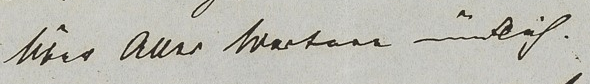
Über Alles weitere mündlich.
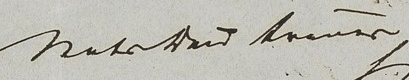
Stets Dein treuer
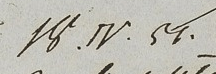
18. IV. 51
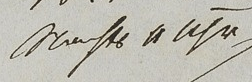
Nachts 11 Uhr
